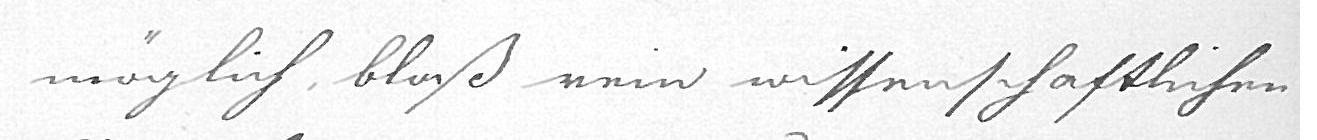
möglich, bloß rein wissenschaftlichen
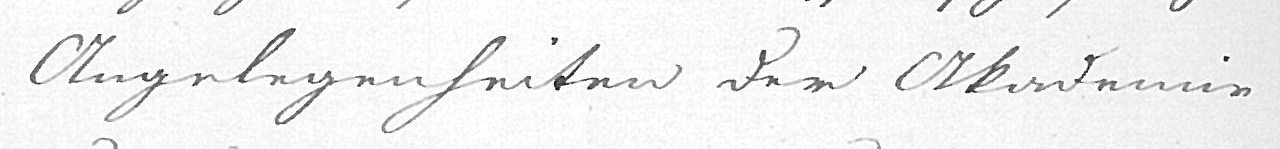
Angelegenheiten der Akademie
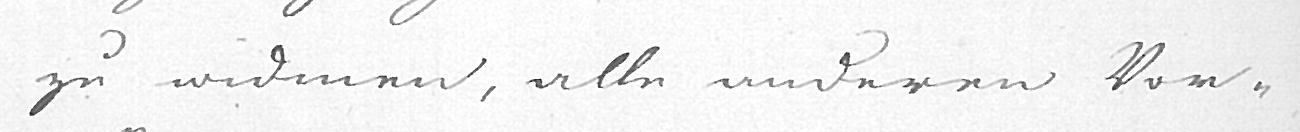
zu widmen, alle anderen Vor-
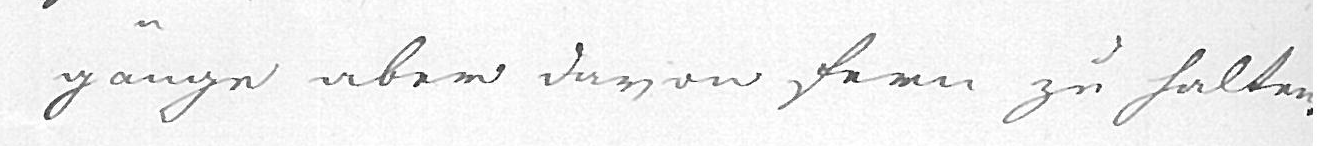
gänge aber davon fern zu halten.
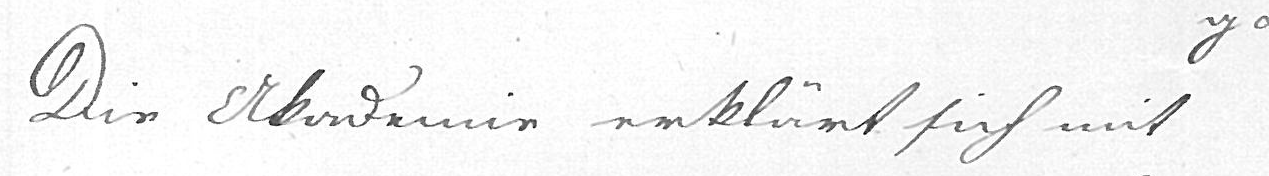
Die Akademie erklärt sich mit
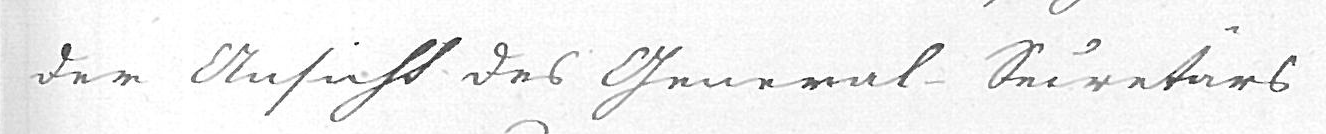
der Ansicht des General-Secretärs
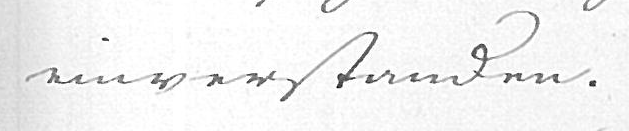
einverstanden.
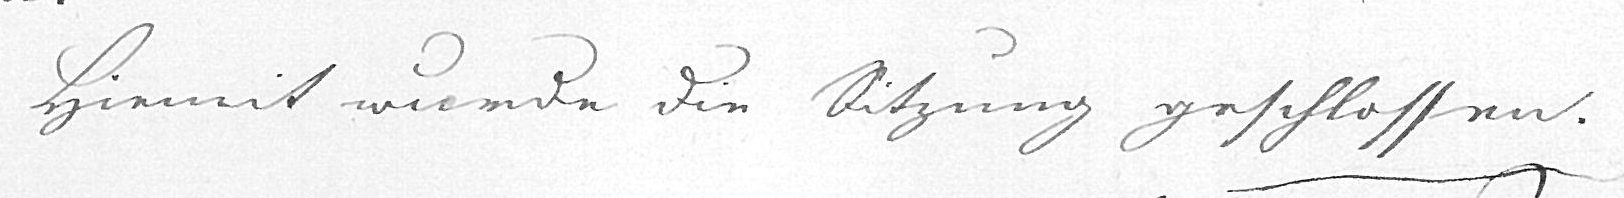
Hiemit wurde die Sitzung geschlossen.
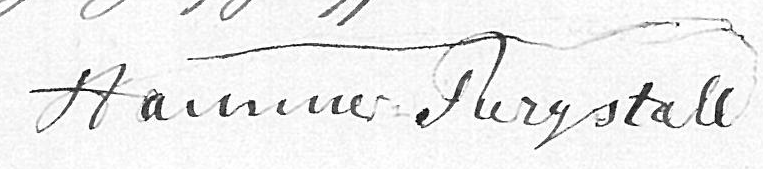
Hammer-Purgstall
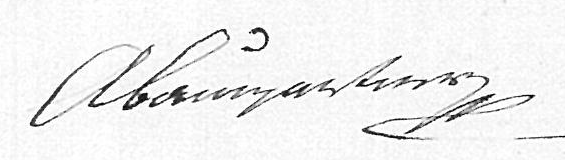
ABaumgartner
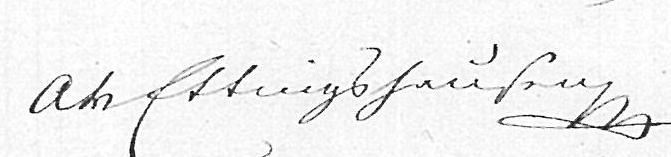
Av Ettingshausen
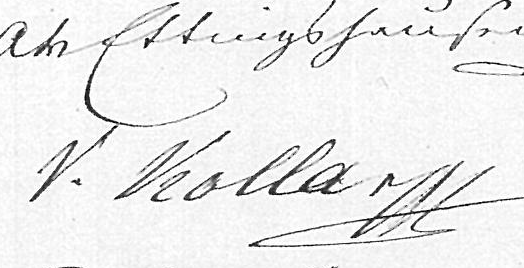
V. Kollar
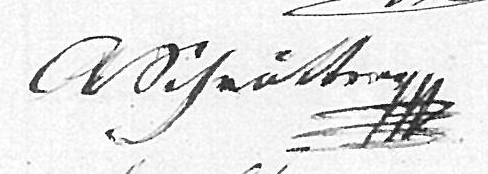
ASchrötter
